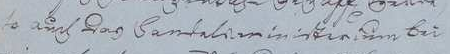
so auch das Handelsministerium bei
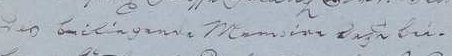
das beiliegende Memoire dazu bei-
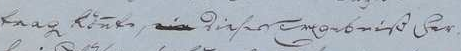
tragen könnte, ein dieses Ergebniß her-
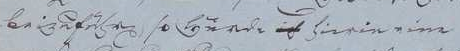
beizuführen, so würde ich hierin eine
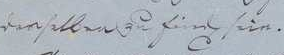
derselben zu finden sein.
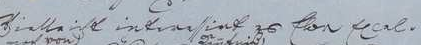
Vielleicht interessirt es Ewr Excel-
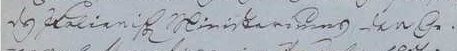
des Italienischen Ministeriums, der Ge-
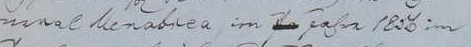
neral Menabrea, im Pa Jahre 1856 im
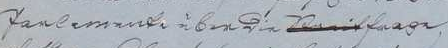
Parlamente über die StreitFrage,
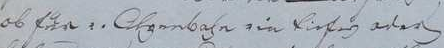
ob für e. Alpenbahn ein tiefes oder
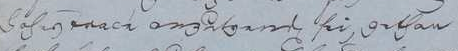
hohes Tracé anzuwenden sei, gethan
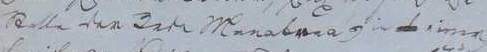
Stelle der Rede Menabrea's in d einer
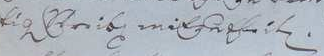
tigen Schreiben mitzutheilen.
